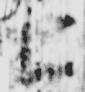里
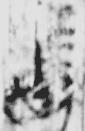繁
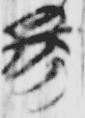昜（陽）
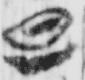旦
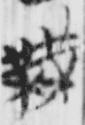無
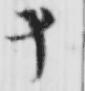又（有）
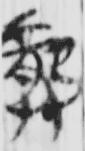龔
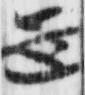正
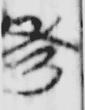秀
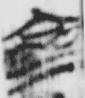齊
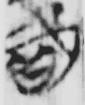戠
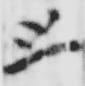之
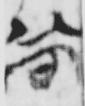尚
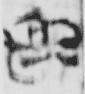爲
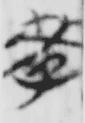李
